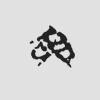寅
